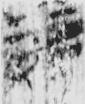競
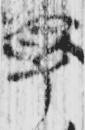○（得）
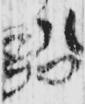訟
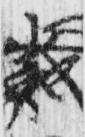緐（繁）
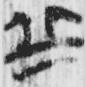丘
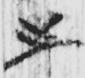之
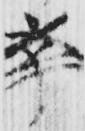南
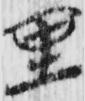里
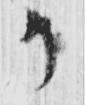人
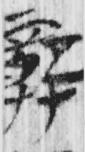龔
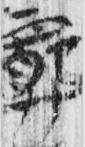龔
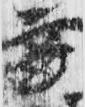栖
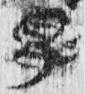{胃刀}（謂）
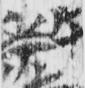殺
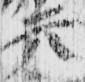亓（其）
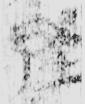○（兄）
